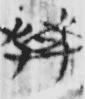登
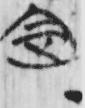定
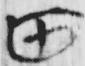甲
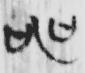申
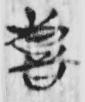喜
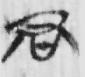君
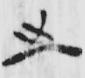之
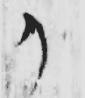人
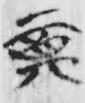奠
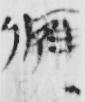雁
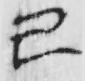己
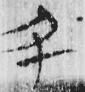丑
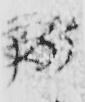新
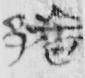都
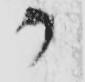人
